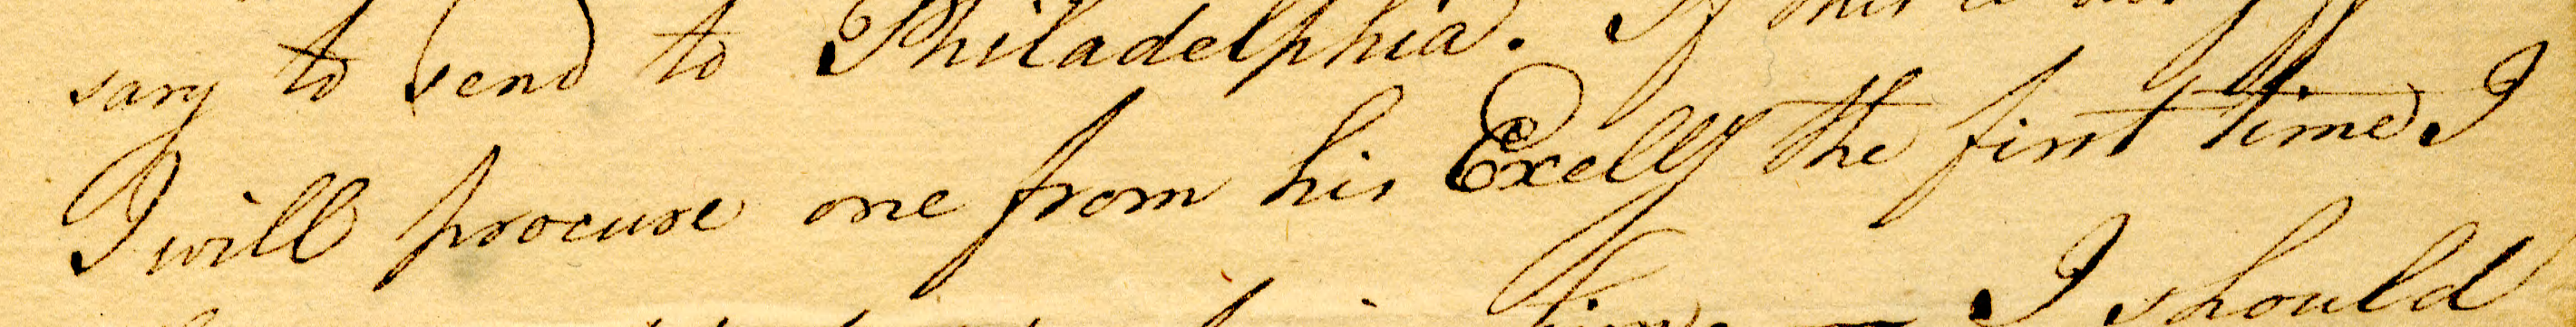I will procure one from his Exelly the first time I
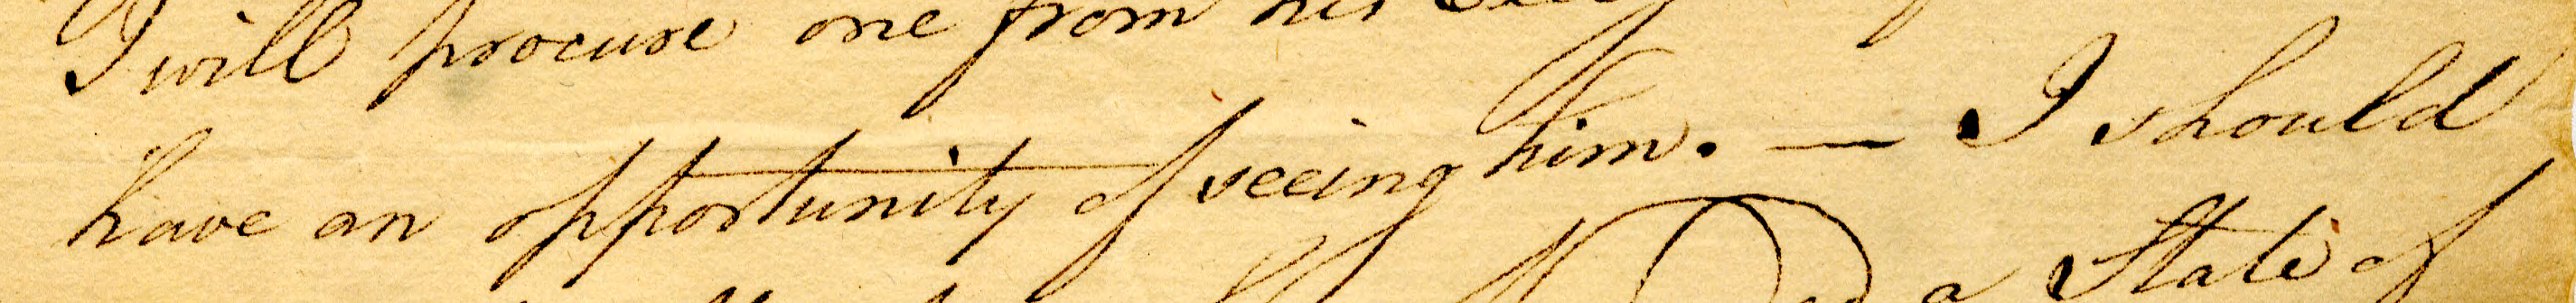have an opportunity of seeing him.- I should
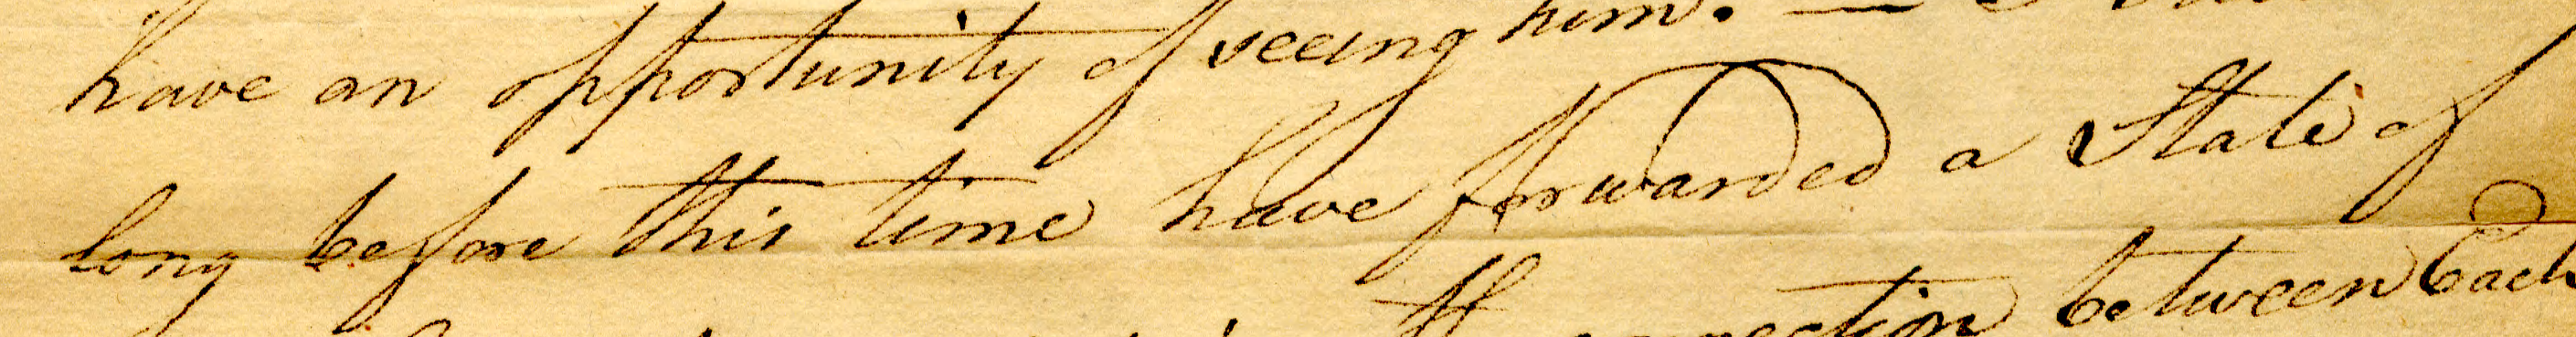long before this time have forwarded a State of
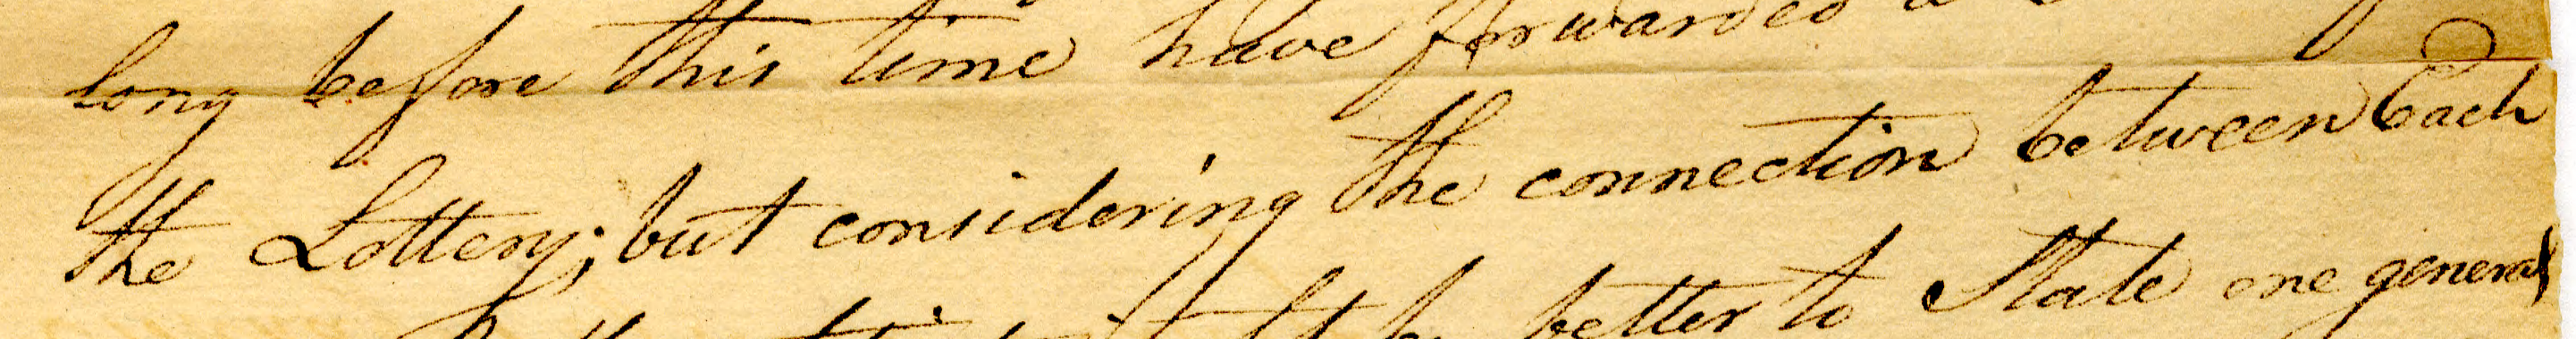the Lottery; but considering the connection between Each
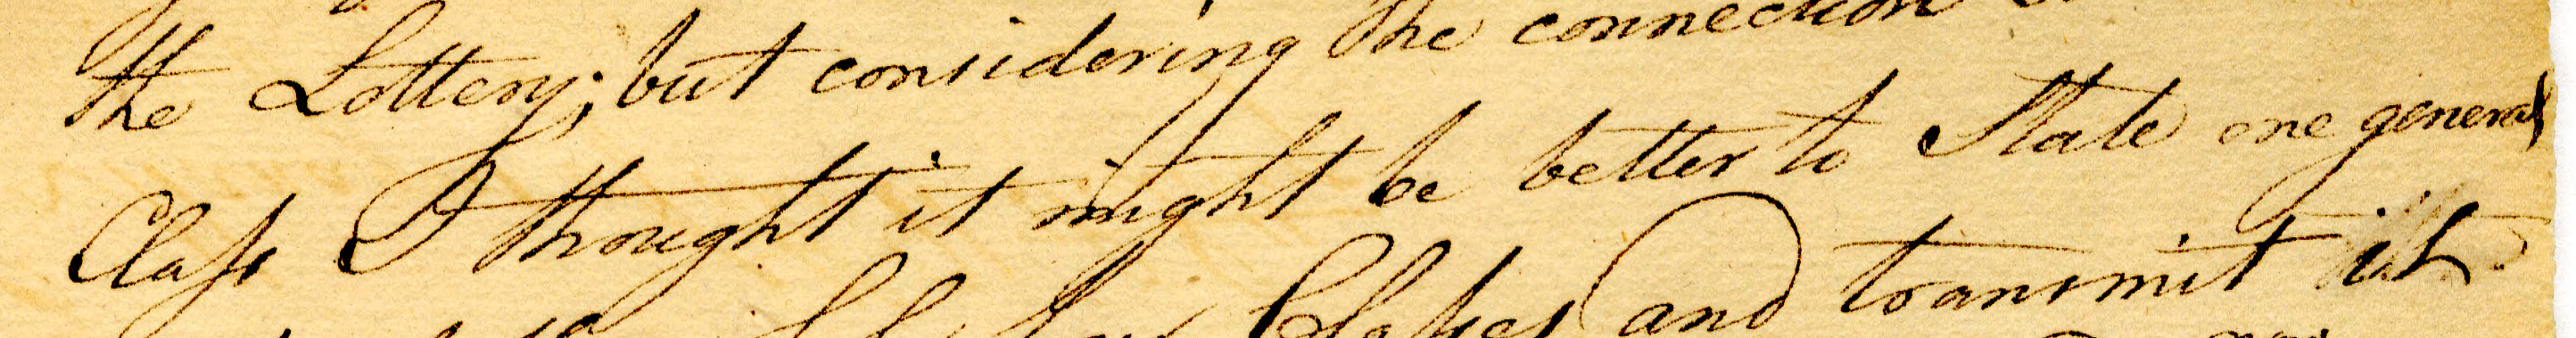Class I thought it might be better to State one general
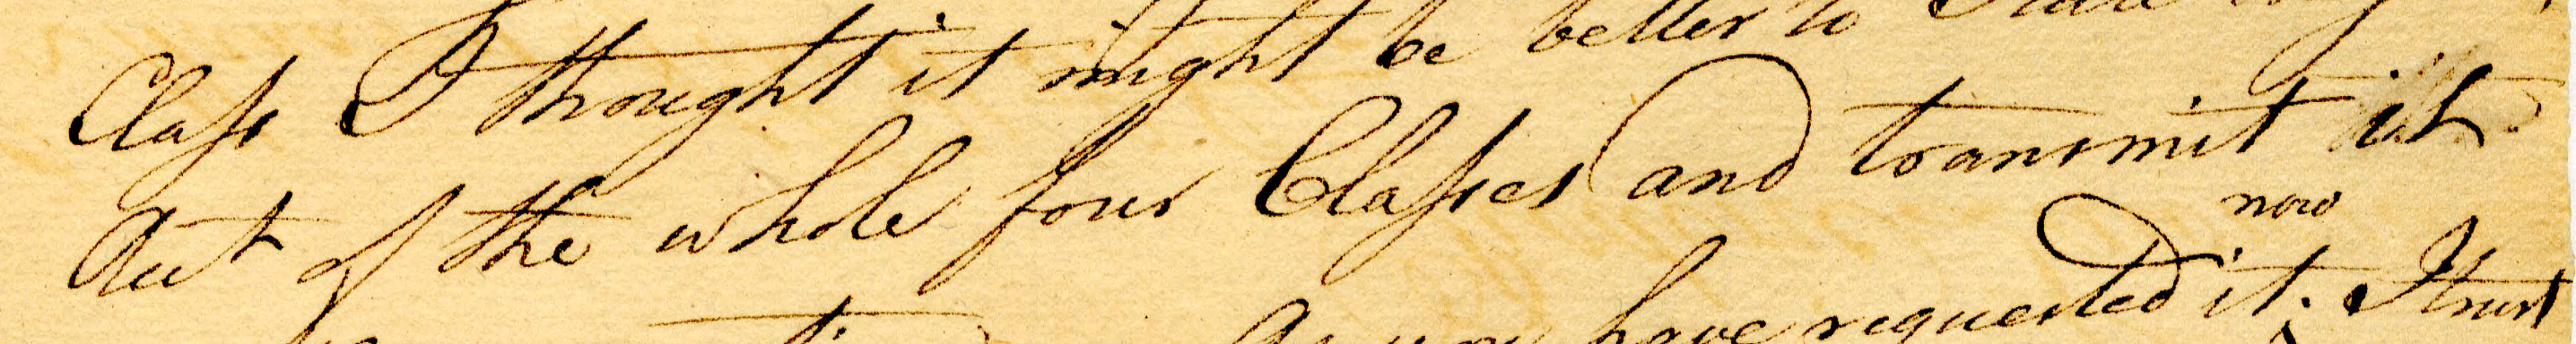Acc^t of the whole four Classes and transmit it
